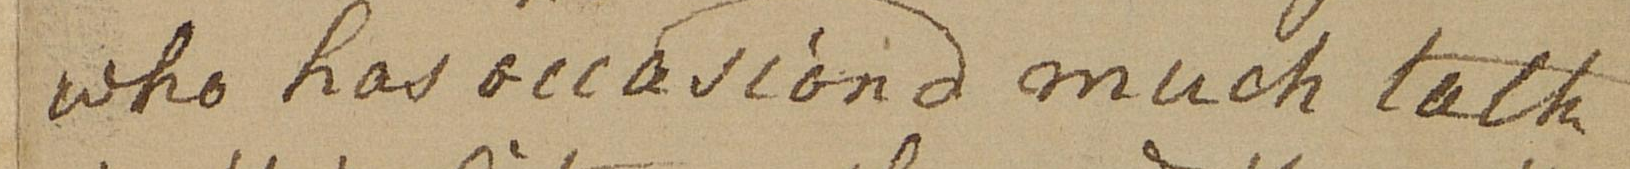who has occasion'd much talk
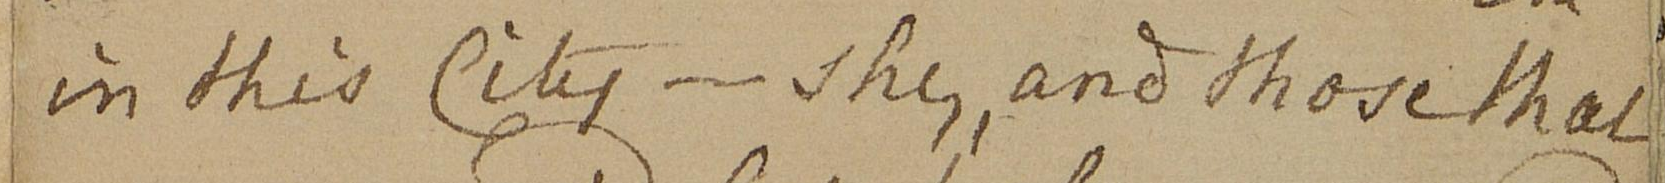in this City- shy, and those that
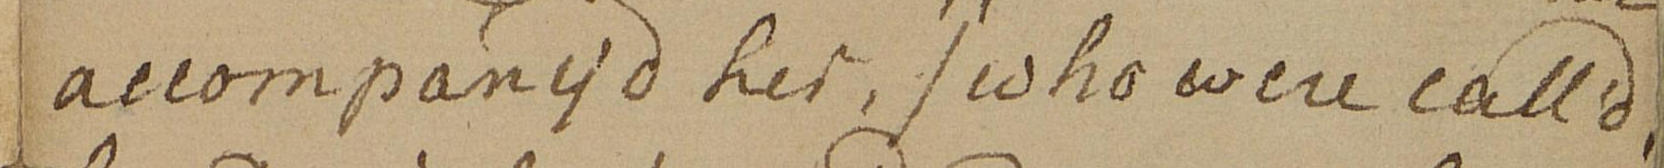accompany'd her, /who were call'd
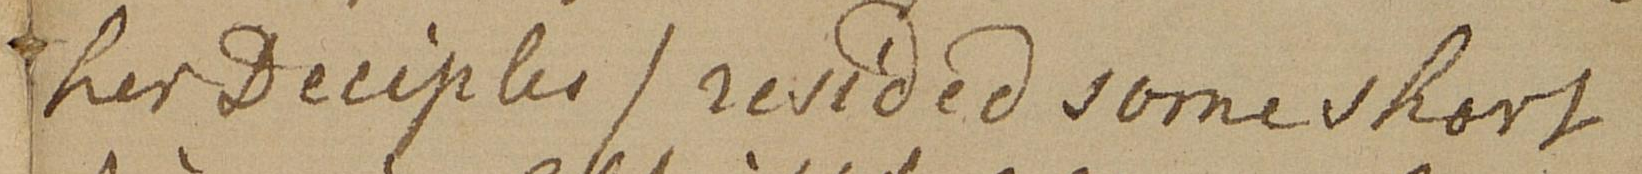her Deciples/ resided some short
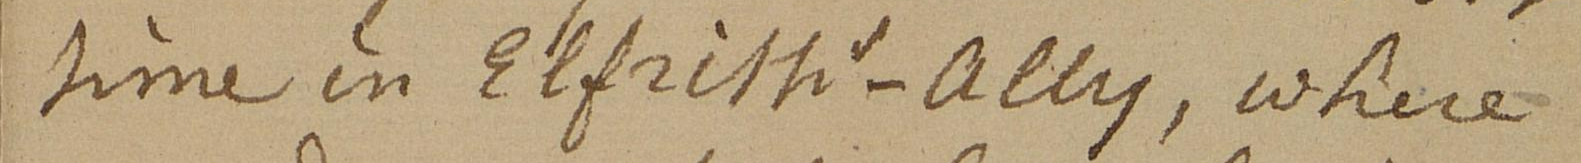time in Elfrith^s-Ally, where
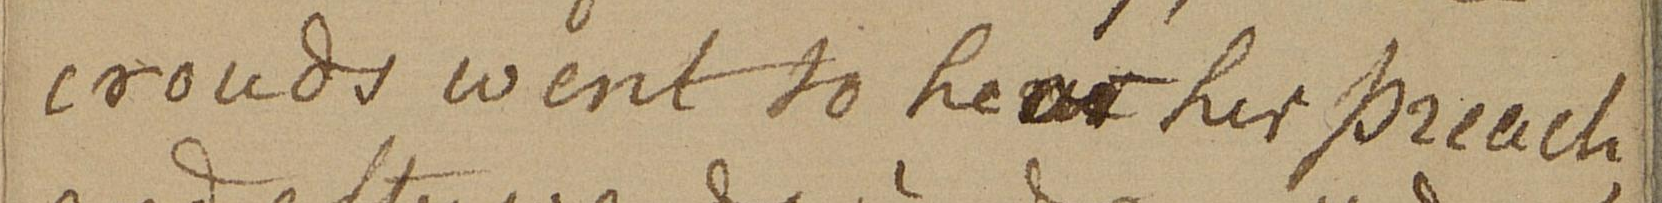crouds went to hear her preach
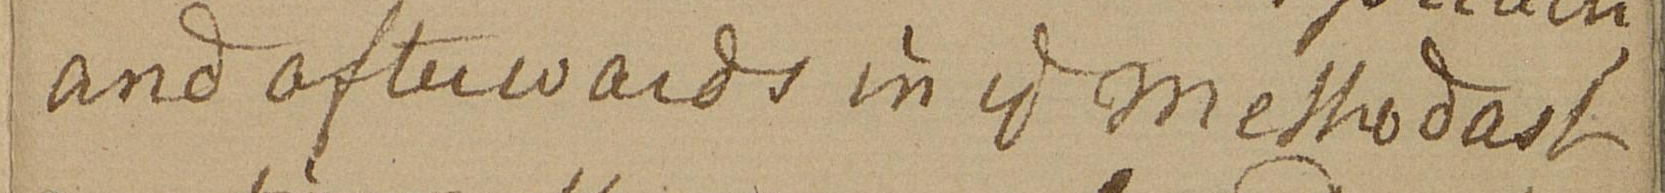and afterwards in y^e Methodast
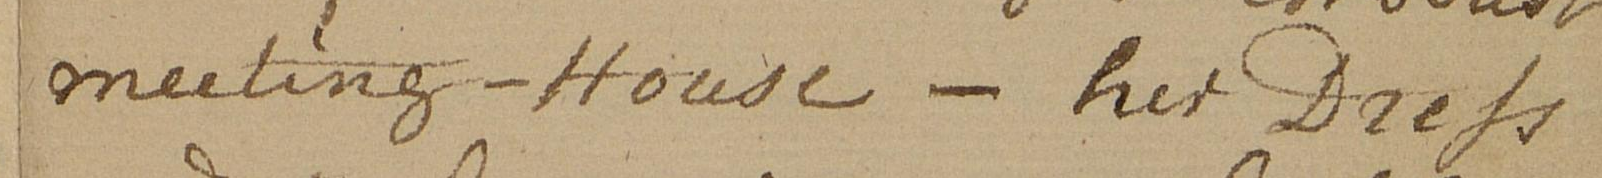meeting-House- her Dress
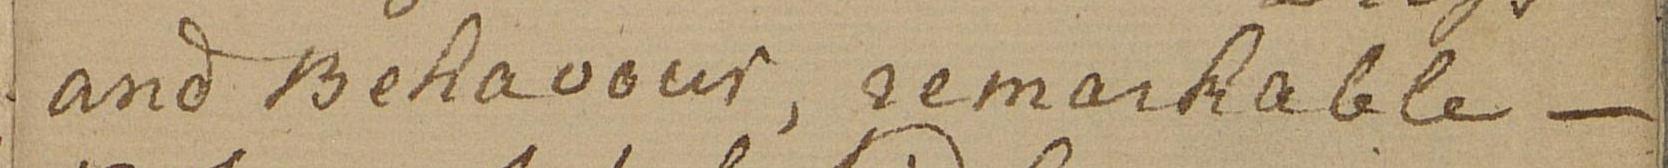and Behavour, remarkable-
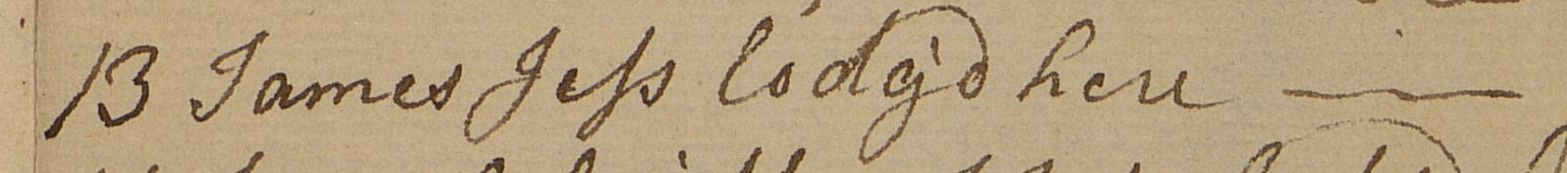13 James Jess lodg'd here-
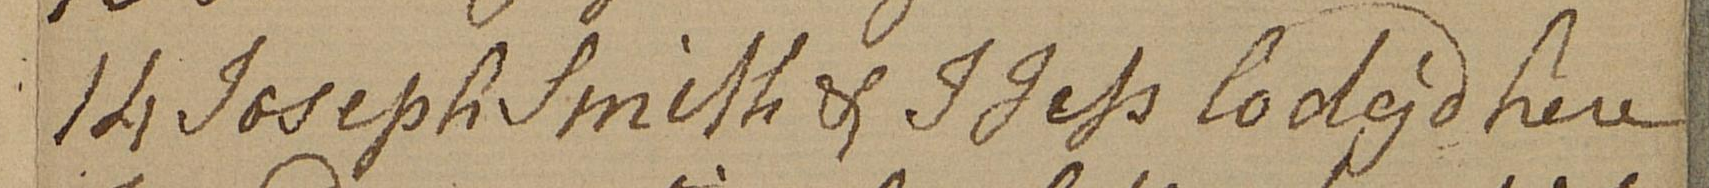14 Joseph Smith & I Jess lodg'd here
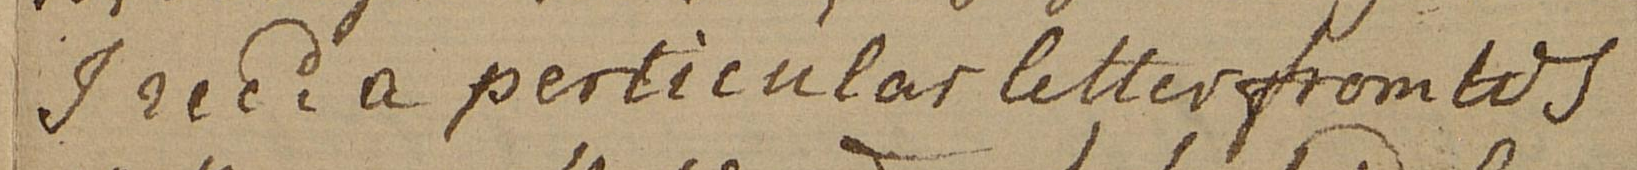I rec^d. a perticular letter from WS
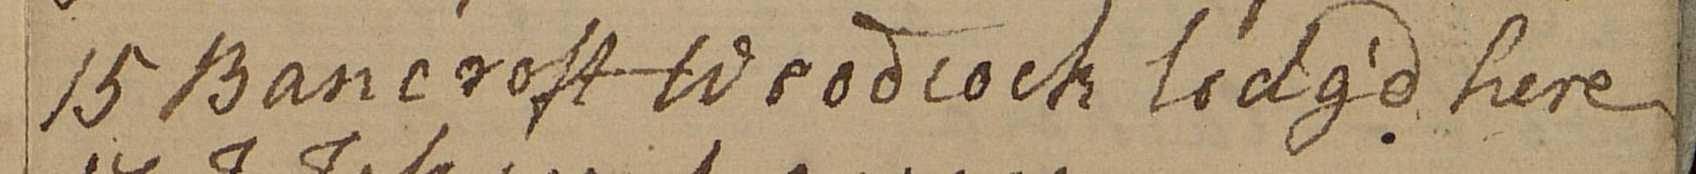15 Bancroft Woodcock lodg'd here
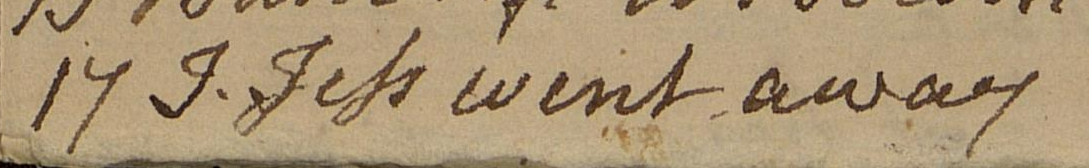17 I. Jess went away
